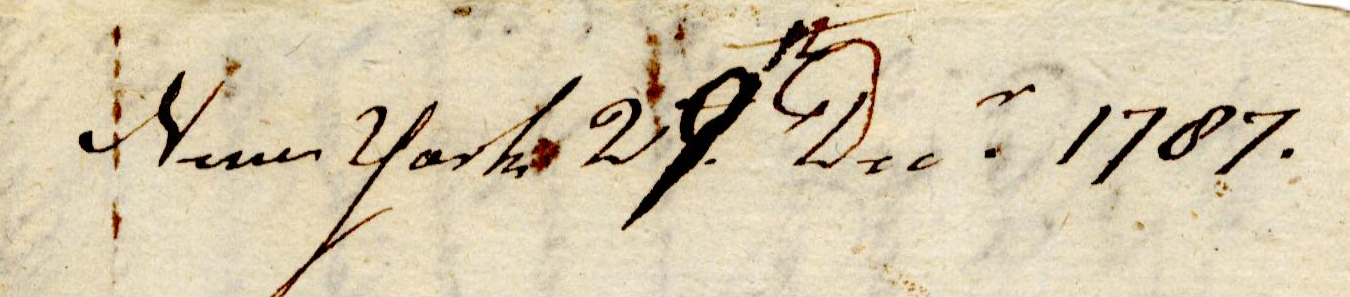New York 29^th. Dec^r. 1787
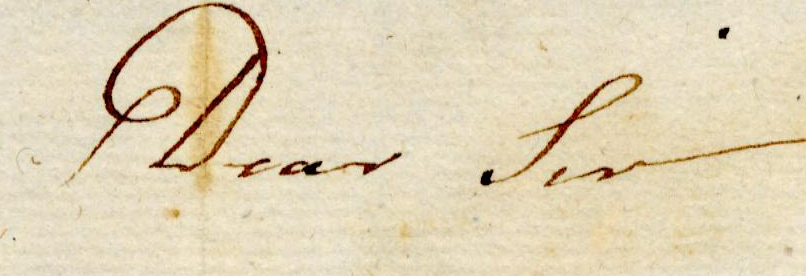Dear Sir
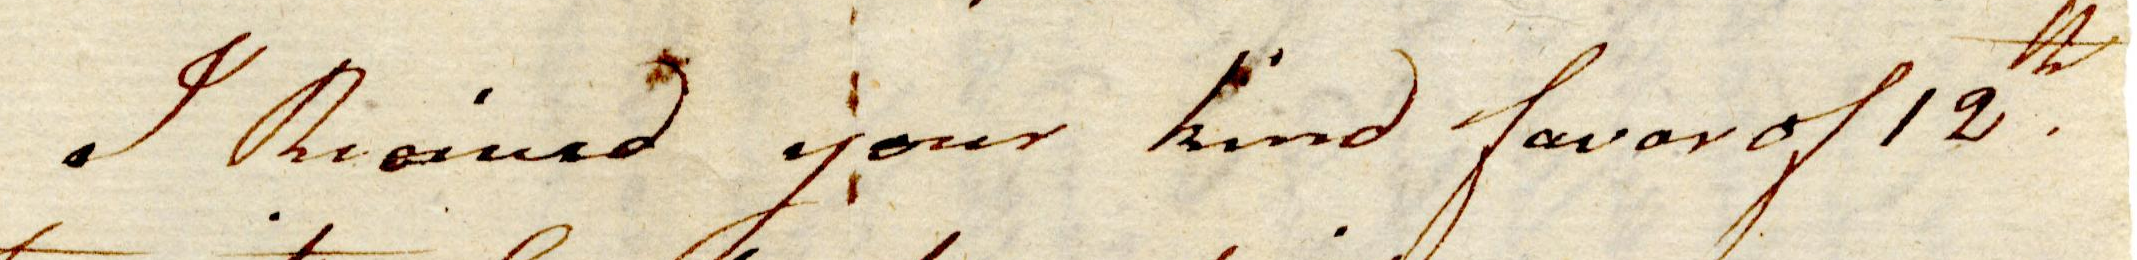I Recieved your kind favor of 12^th.
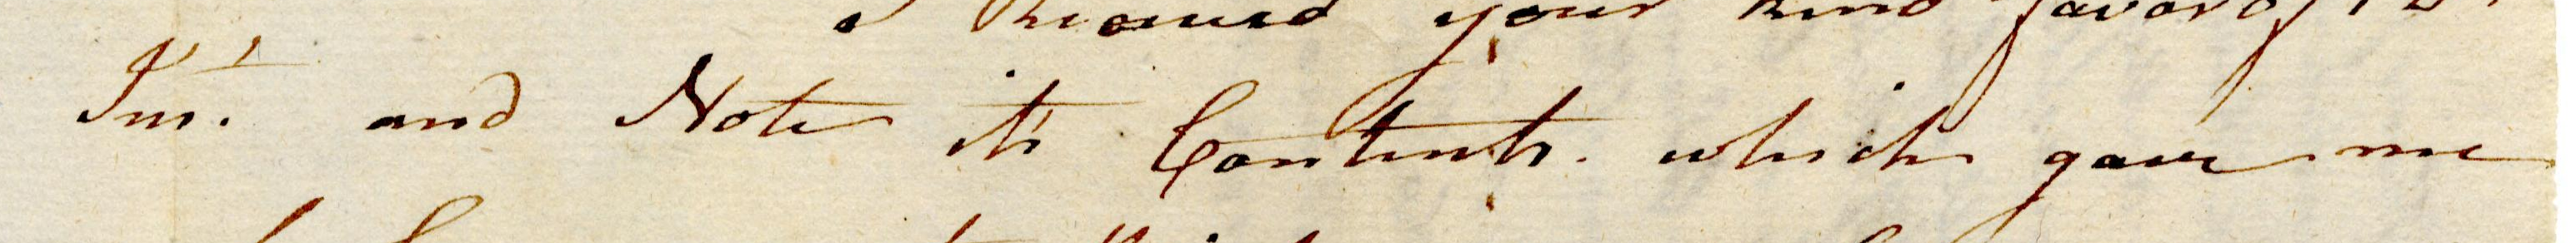Ins^t. and Note its contents which gave me
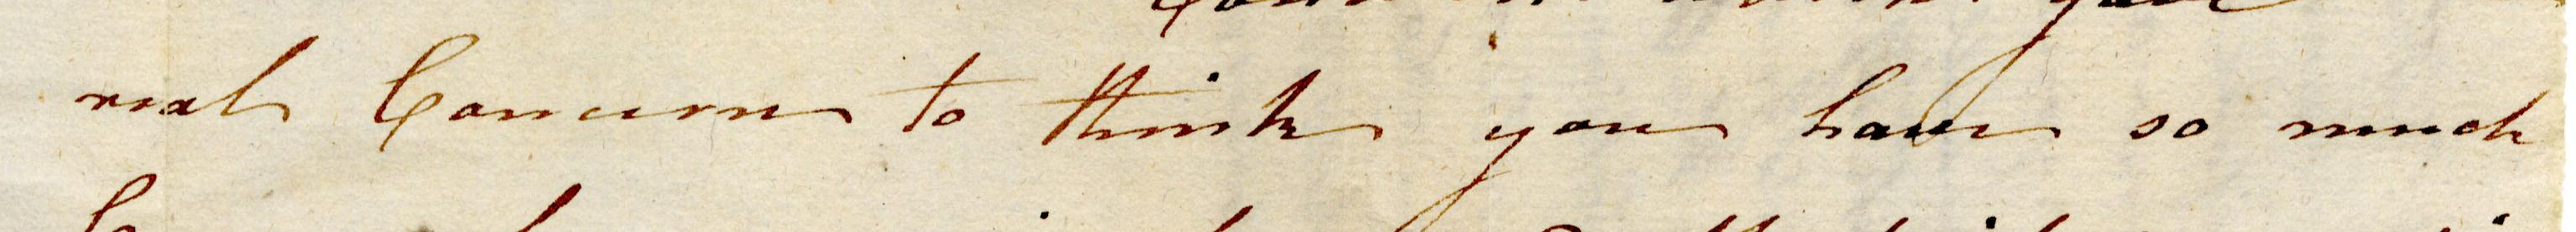real concern to think you have so much
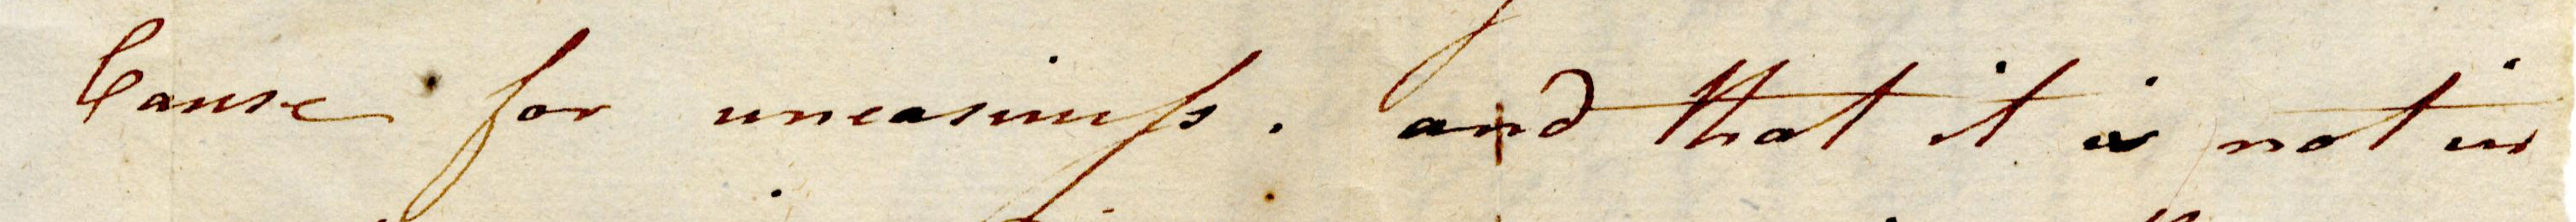Cause for uneasiness. and that it is not in
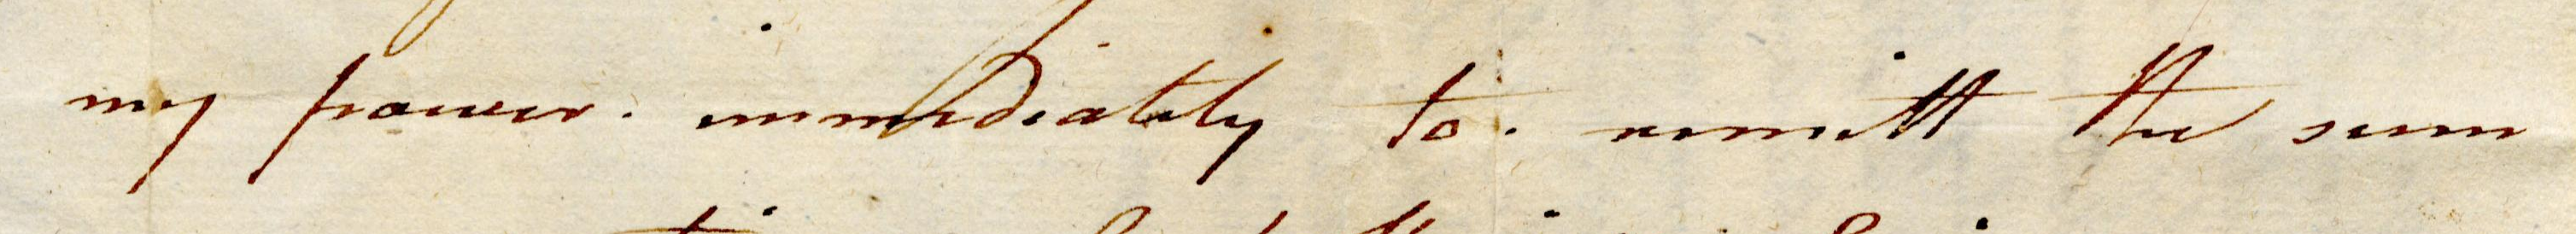my power immediately to remitt the sum
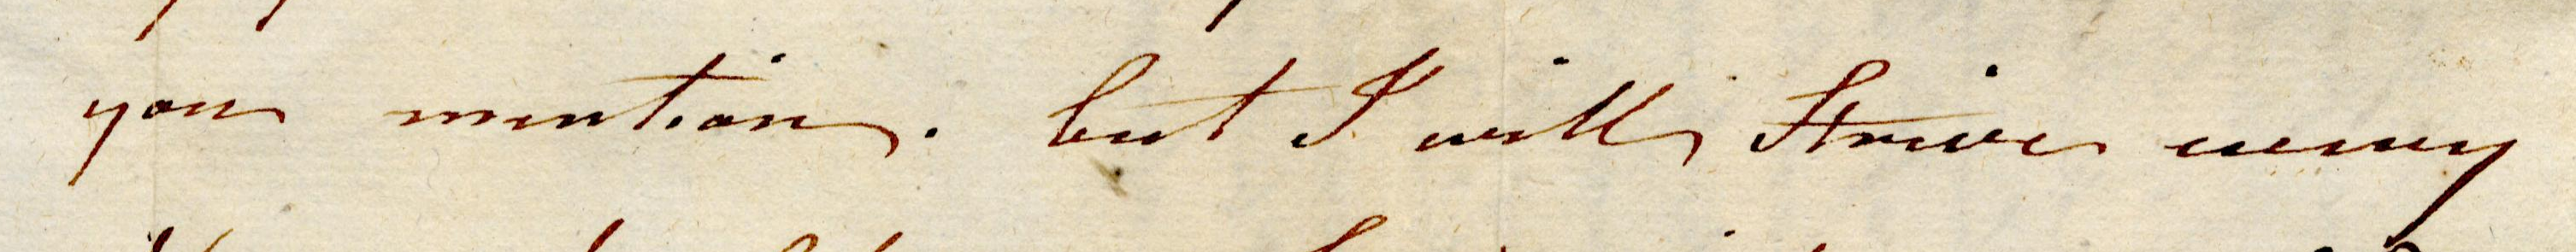you mention. but I will Strive every
